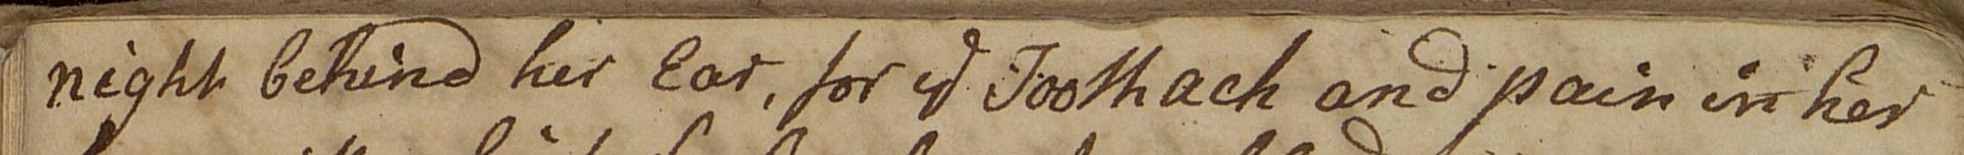night behind her Ear, for y^e Toothach and pain in her
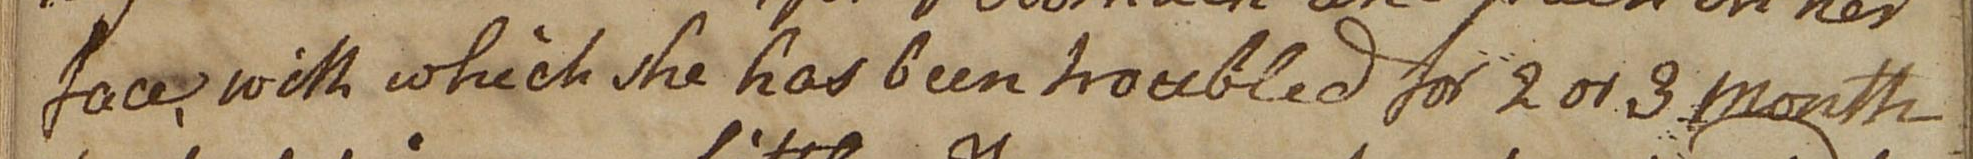face, with which she has been troubled for 2 or 3 Month
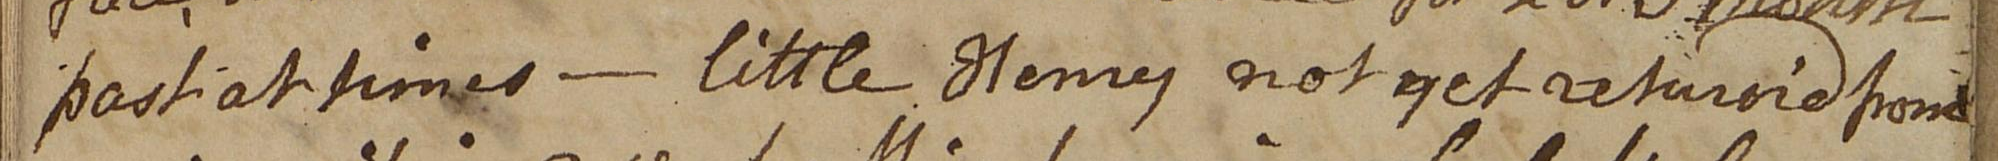past at times- little Henry not get return'd [frond]
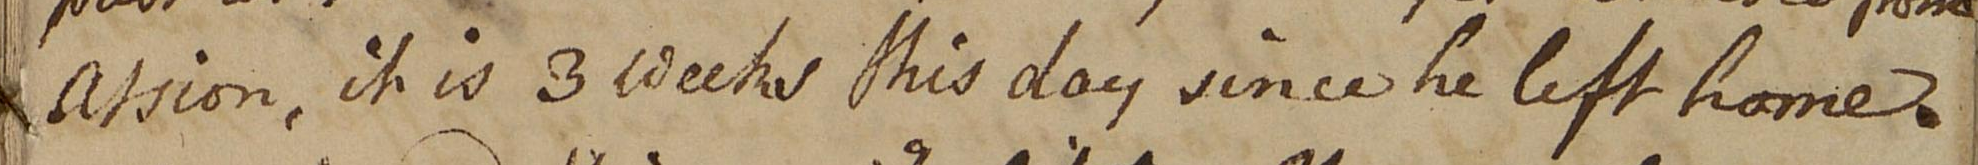Assion, it is 3 weeks this day since he left home.
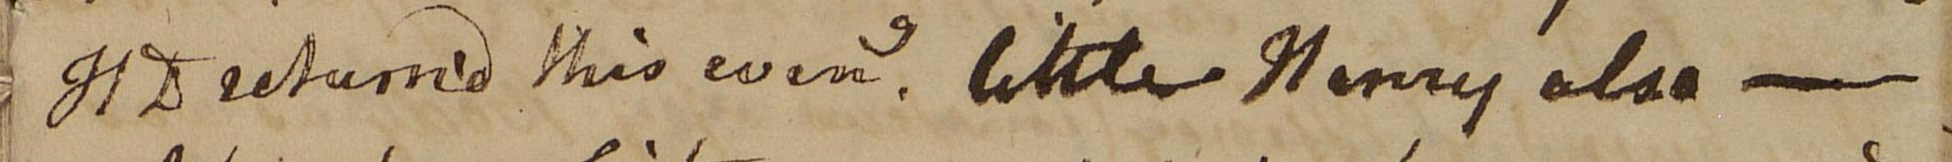H D return'd this even^g. little Henry also-
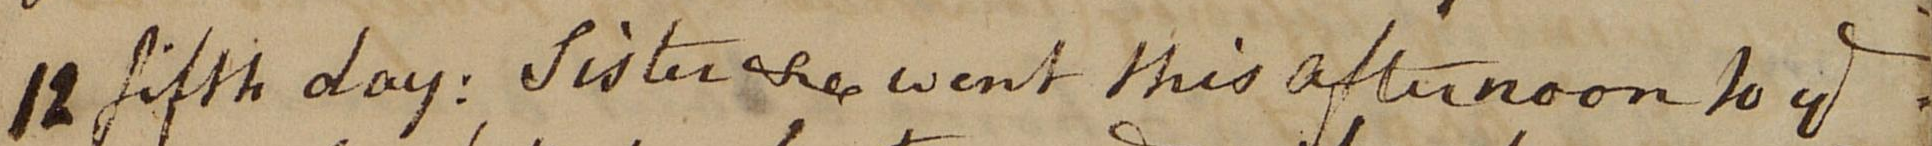12 fifth day: Sister &c went this afternoon to y^e
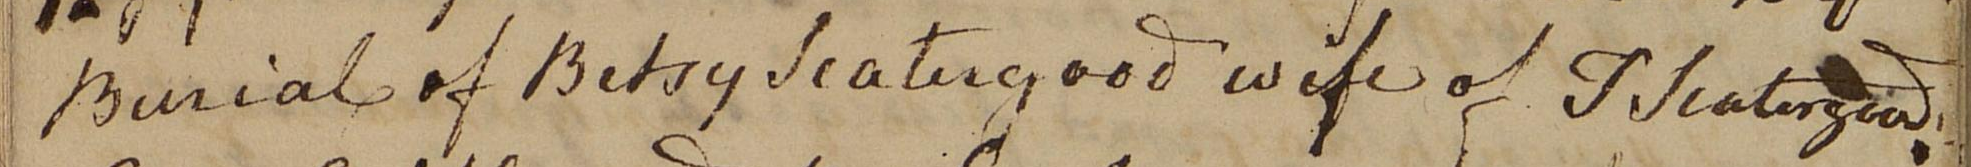Burial of Betsy Scatergood wife of T Scatergood
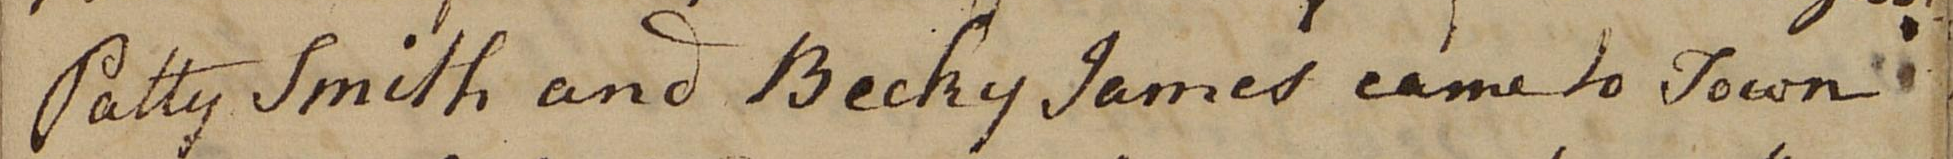Patty Smith and Becky James came to Town
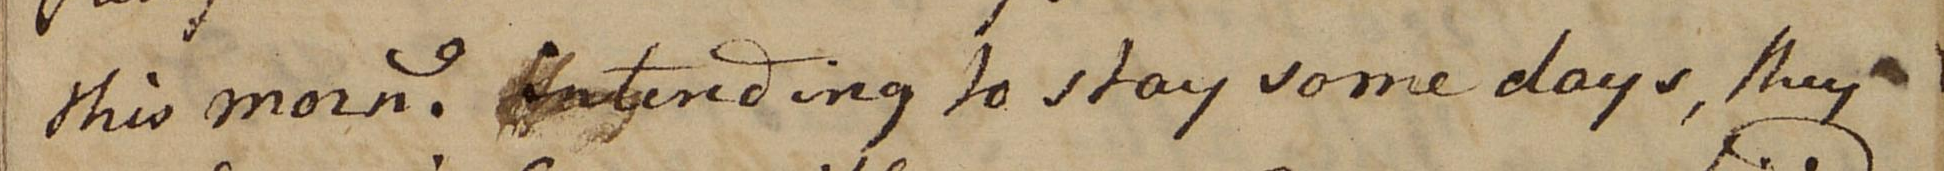this morn^g. intending to stay some days, they
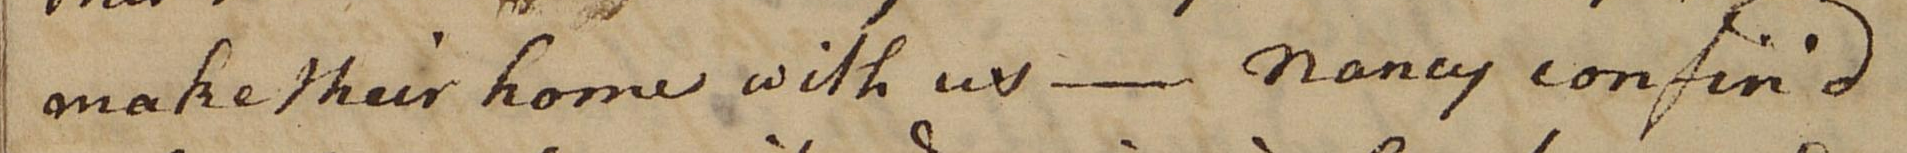make their home with us- Nancy confin'd
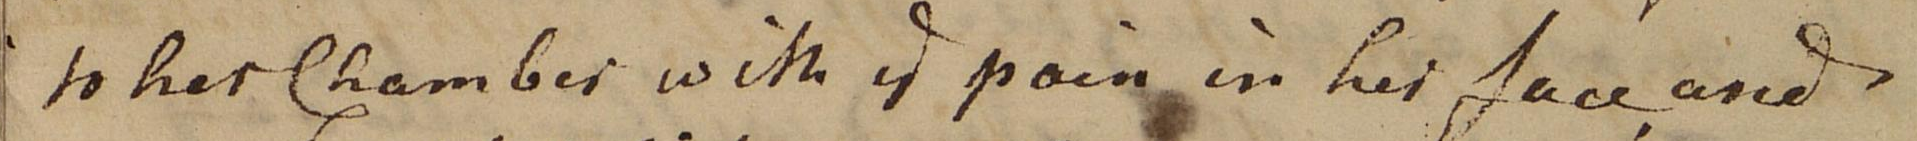to her Chamber with y^e pain in her face, and
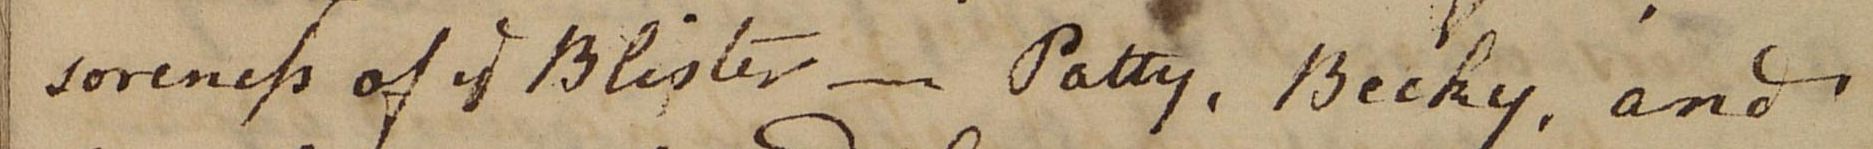soreness of y^e Blister- Patty, Becky, and
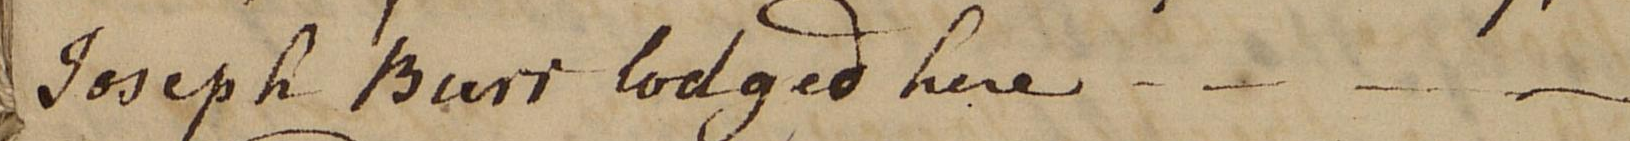Joseph Burr lodged here---
